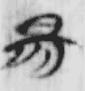昜（陽）
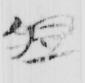○（厨）
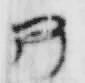尹
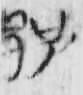○（枝）
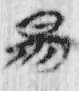昜（陽）
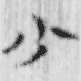少
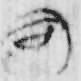司
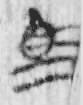馬
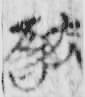○（胡）
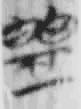○（盬）
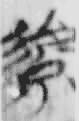虩
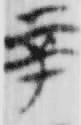辛
